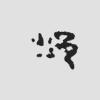邦
